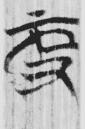{卞又}
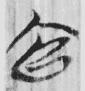官
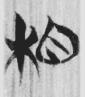相
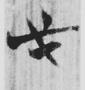弋
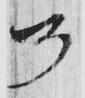乃
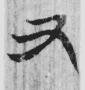又
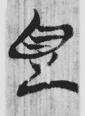見
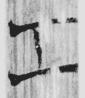工
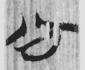公
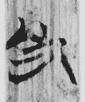及
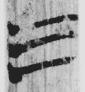三
